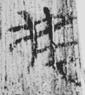弗
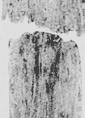京（諒）
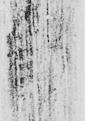○（鬼）
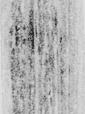神
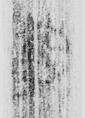禋
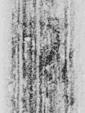祀
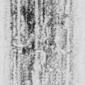上
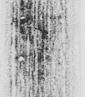帝
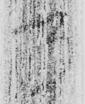乃
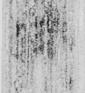○（治）
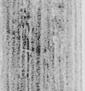邦
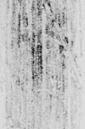○（家）
